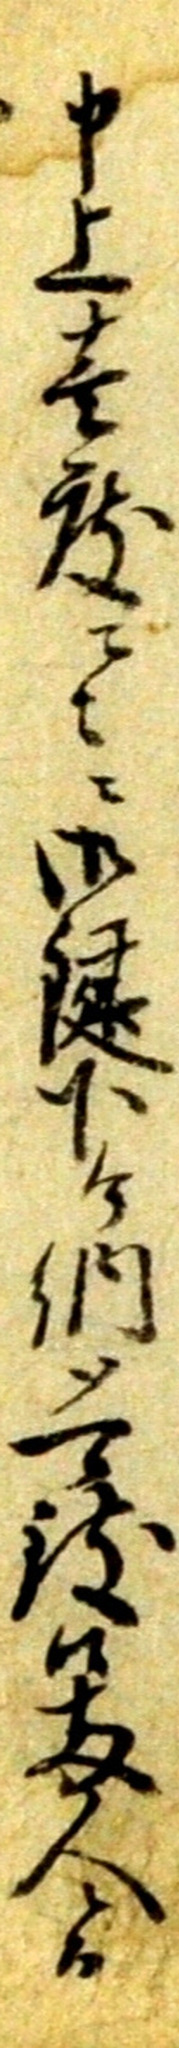申上壱度〻〻ニ御鍵下ケ納メ可致候両人ニ而
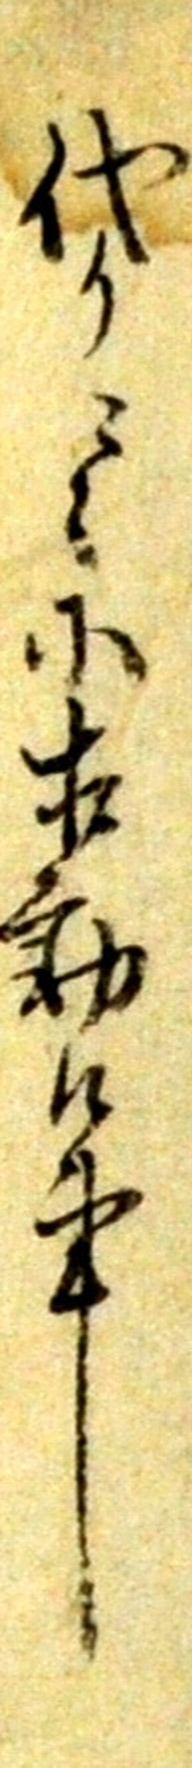代り〻〻に相勤候事

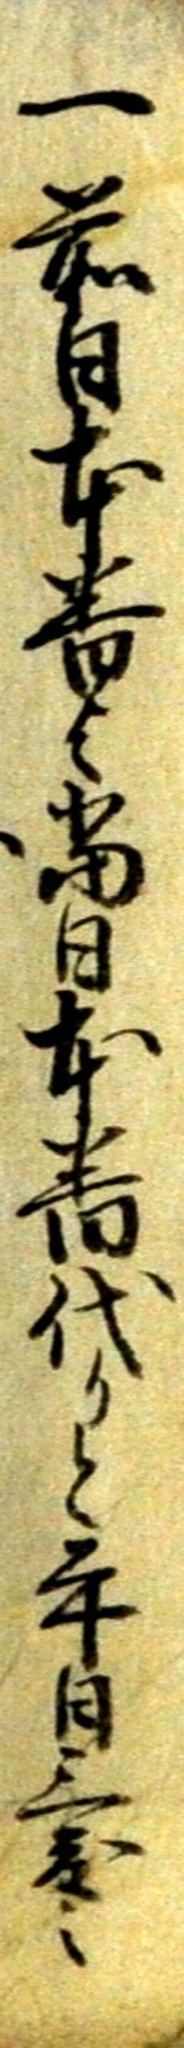一前日本番と当日本番代りと平日三度之
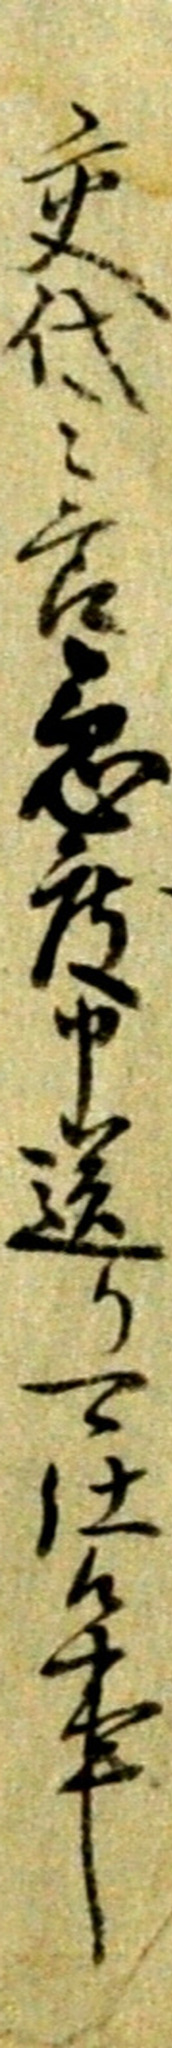交代之節急度申送り可仕候事
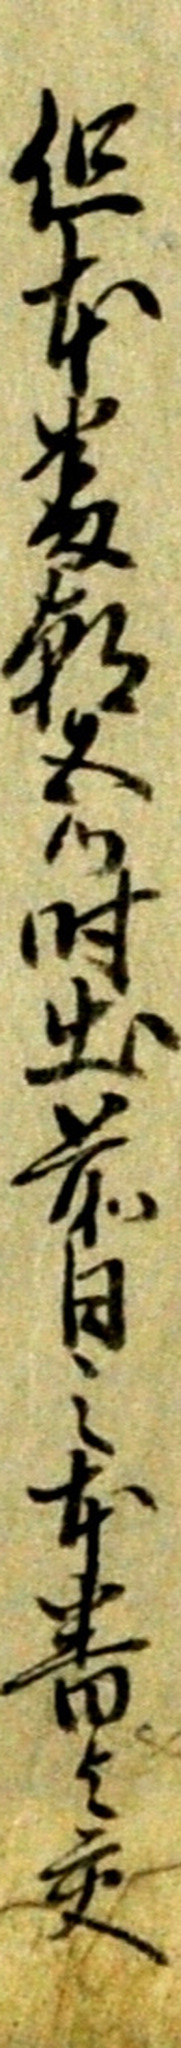但本番朝五ツ時出前日之本番と交
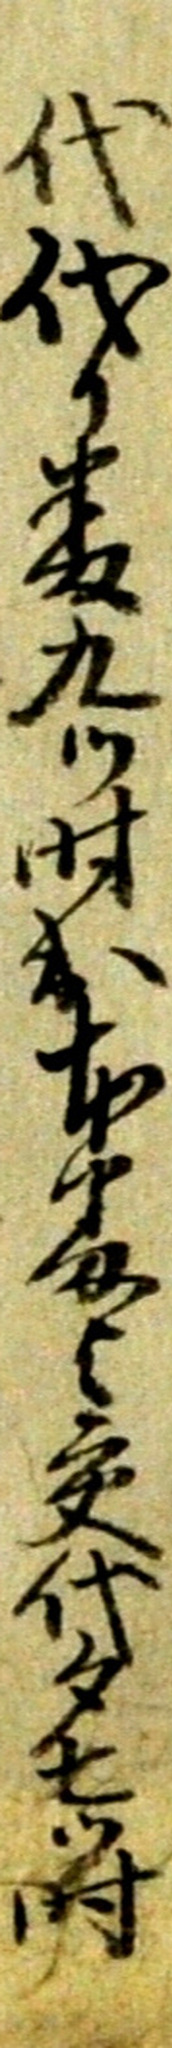代代り番九ツ時出本番と交代夕七ツ時
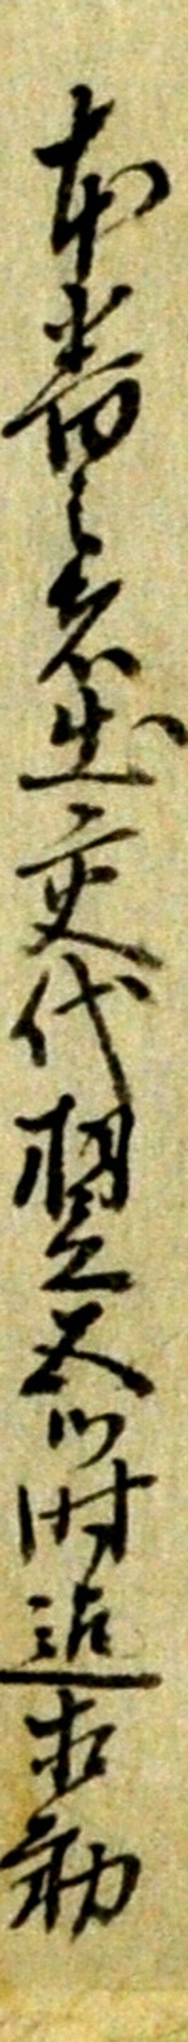本番之者出交代翌五ツ時迄相勤
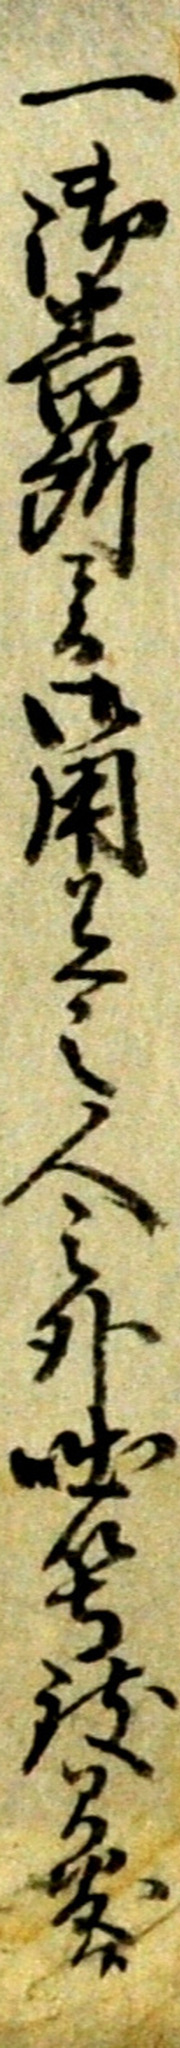一御番所ニ而御用有之人之外咄等致間敷候
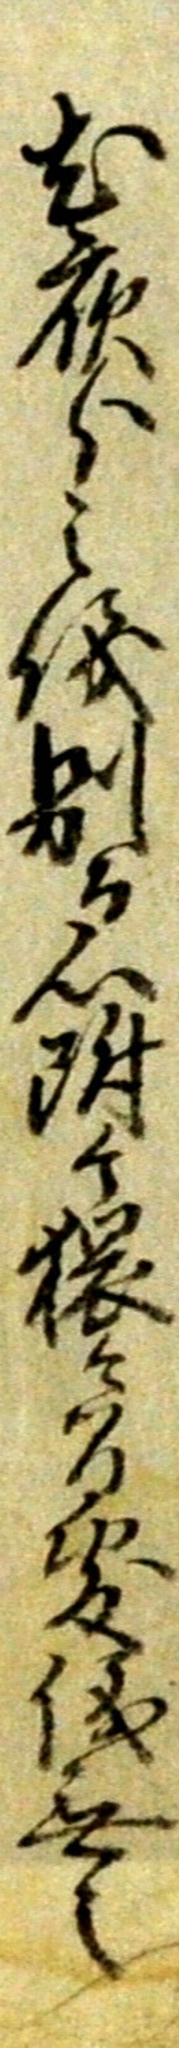尤夜分之儀別而心附ケ猥ケ間敷儀無之
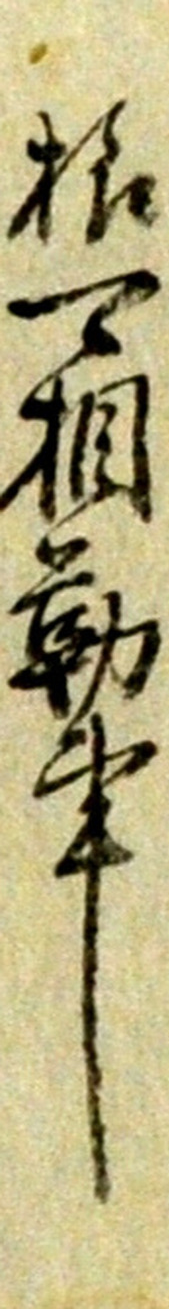様可相勤事
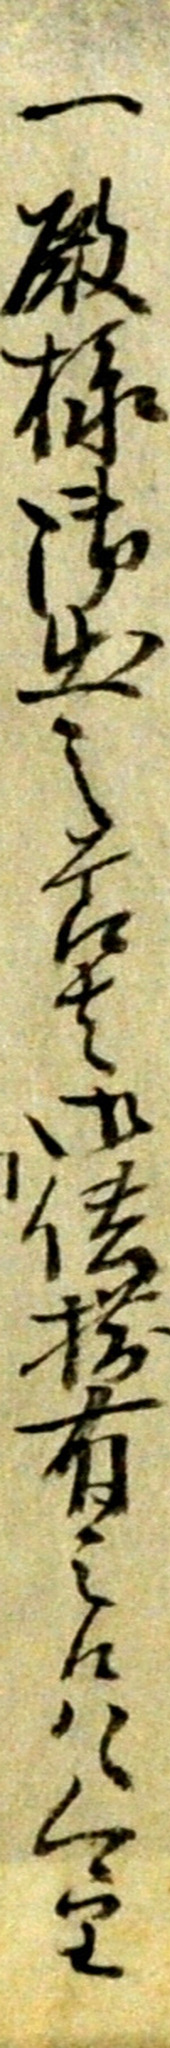一殿様御出之節御供揃有之候ハヽくゝり
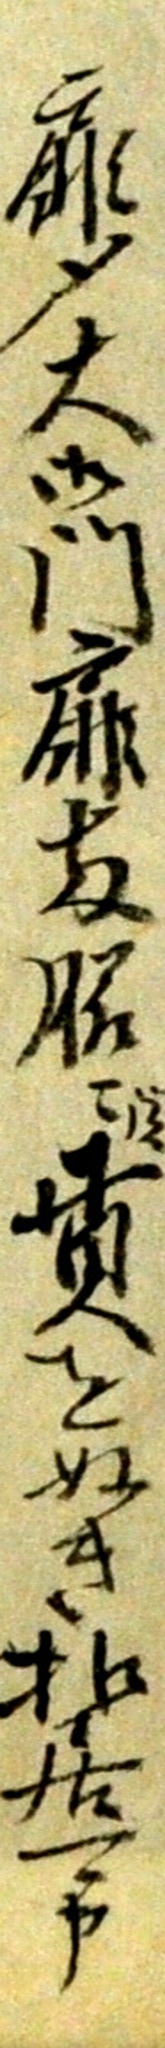扉〆大御門扉両脇ニ貫をぬき扣居可申
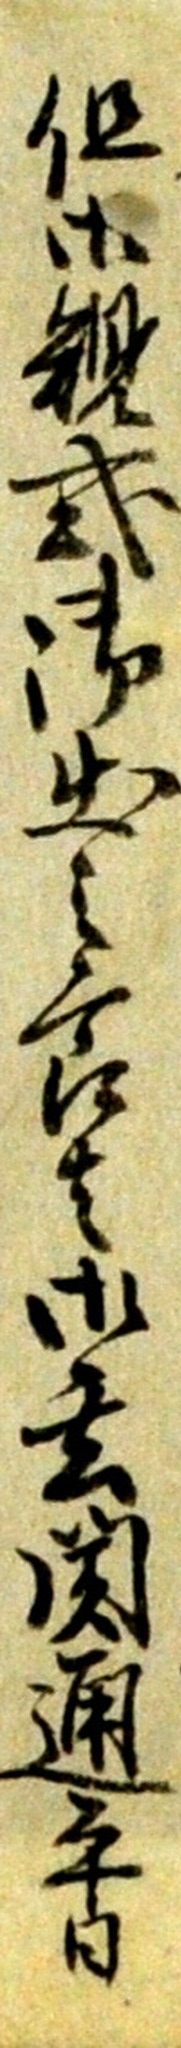但御親式御出之節者御玄関通平日
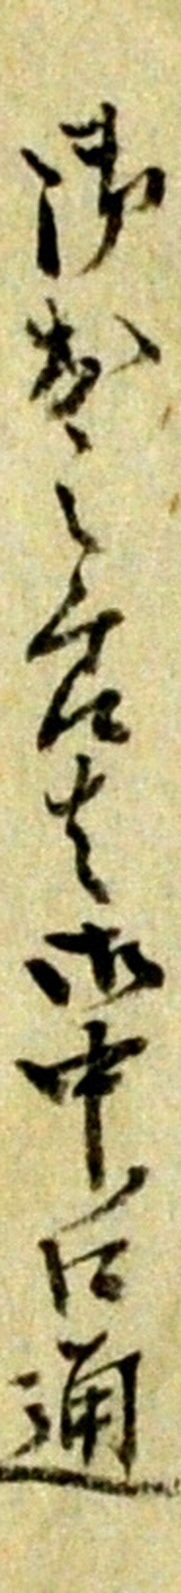御出之節者御中ノ口通
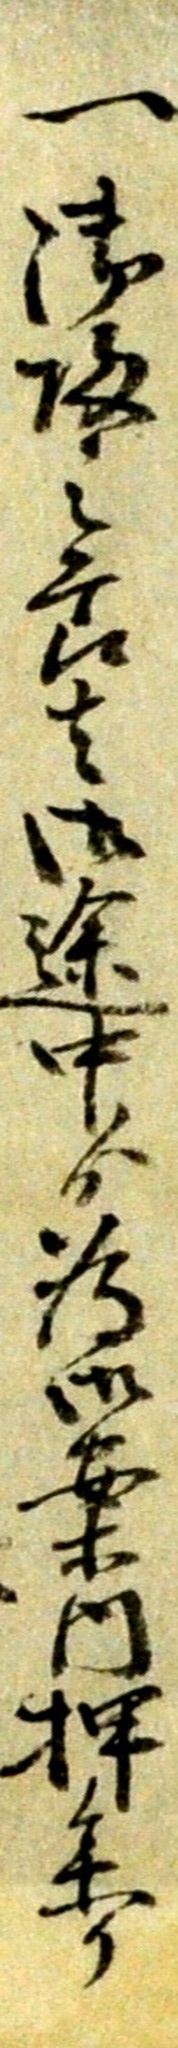一御帰之節者御途中ゟ為御案内押参り
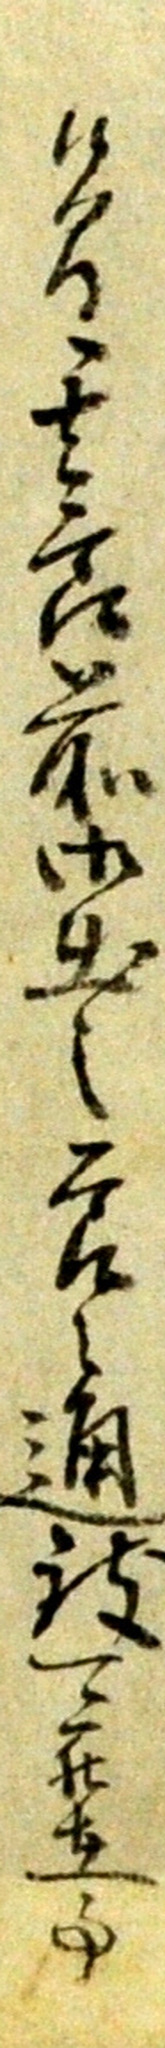候間其節前御出之節之通致可罷在事
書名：御先手組江戸御屋敷御門番勤方
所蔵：伊那市立高遠町図書館・合同会社AMANE
